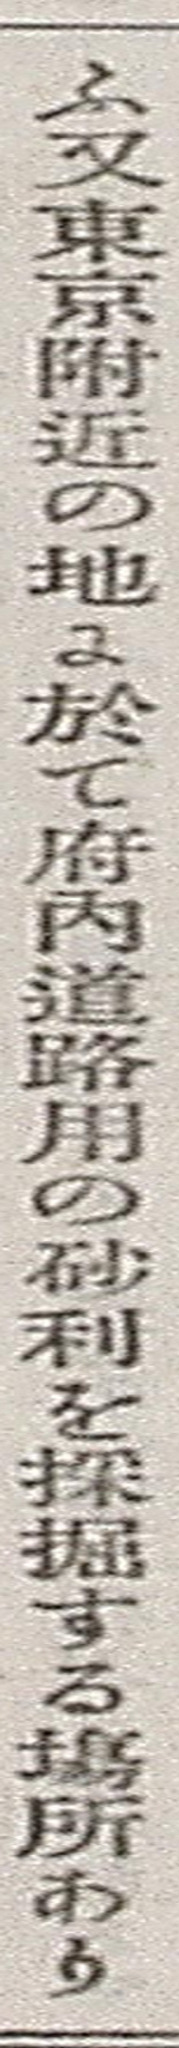ふ又東京付近の地に於て府内道路用の砂利を採掘する場所あり
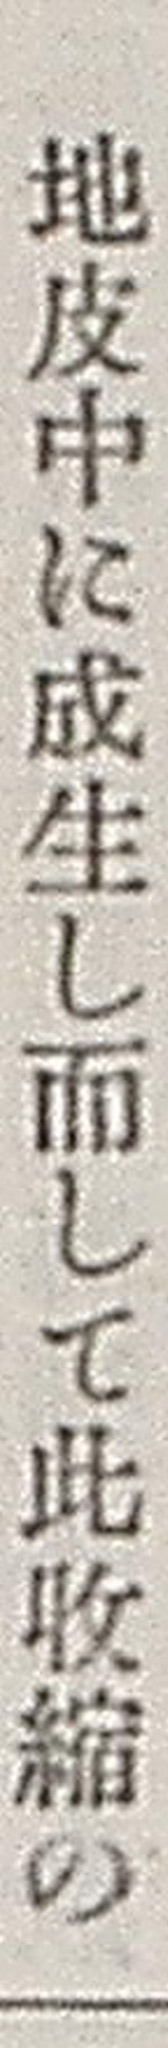地皮中に成生し而して此収縮の
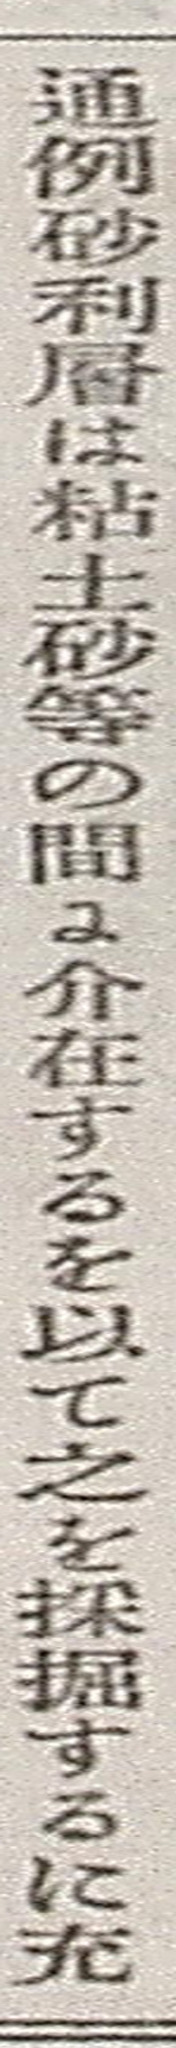通例砂利層は粘土砂等の間に介在するを以て之を採掘するに充
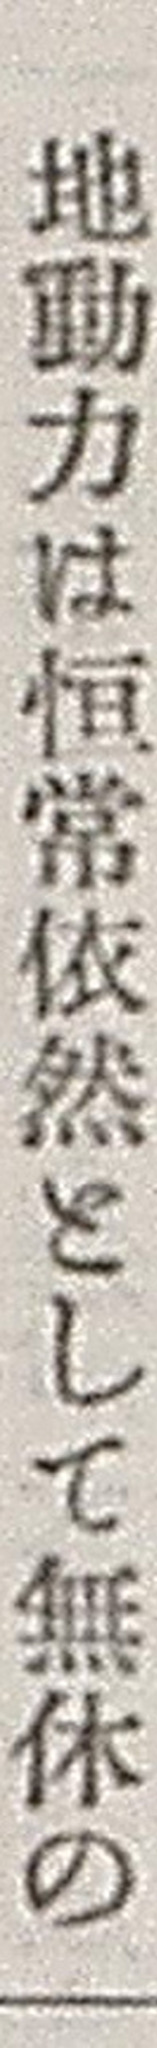地動力は恒常依然として無休の
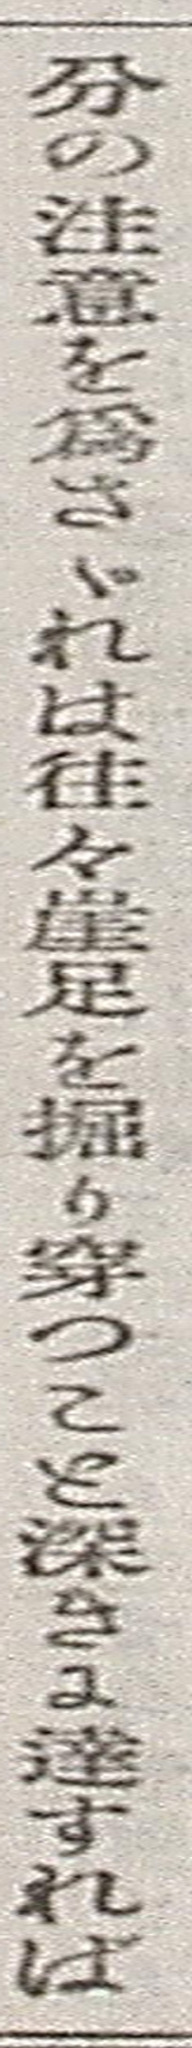分の注意を為さゞれは往々崖足を堀り穿つこと深きに達すれば
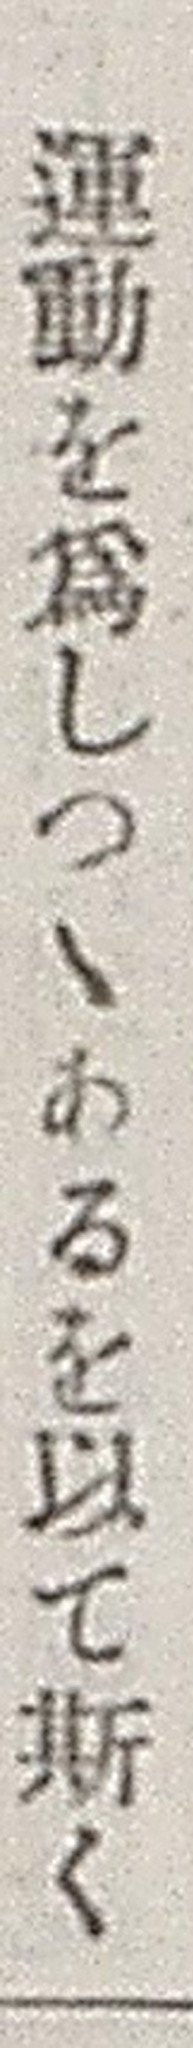運動を為しつゝあるを以て斯く
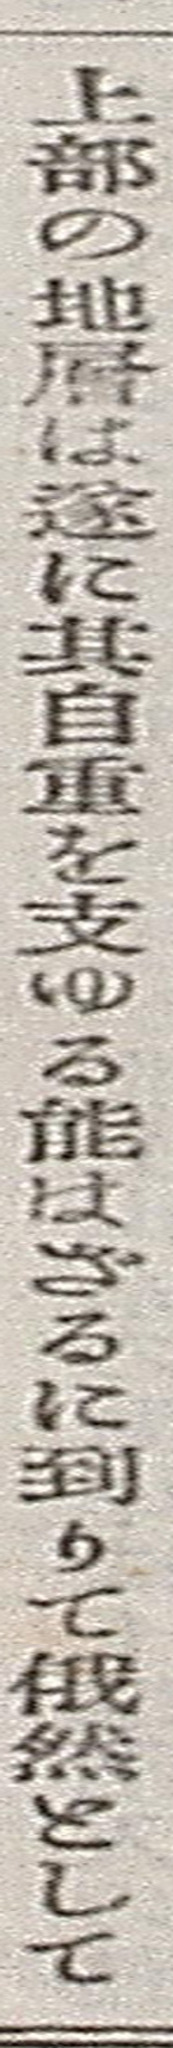上部の地層は遂に其自重を支ゆる能はざるに到りて俄然として
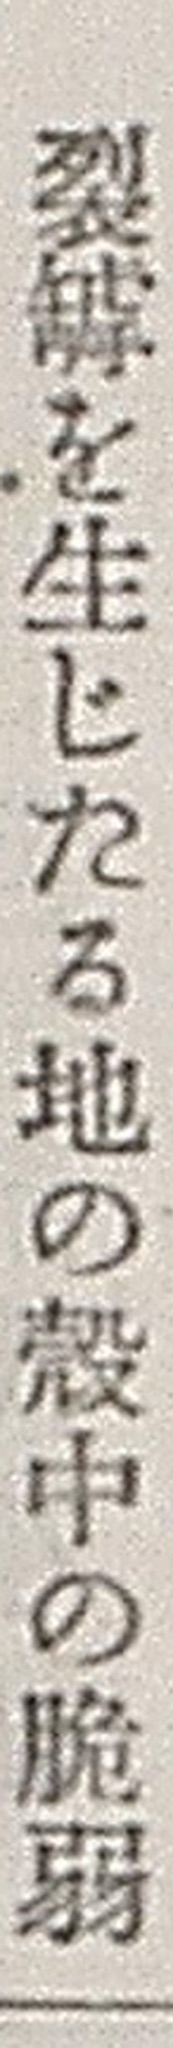裂罅を生じたる地の殻中の脆弱
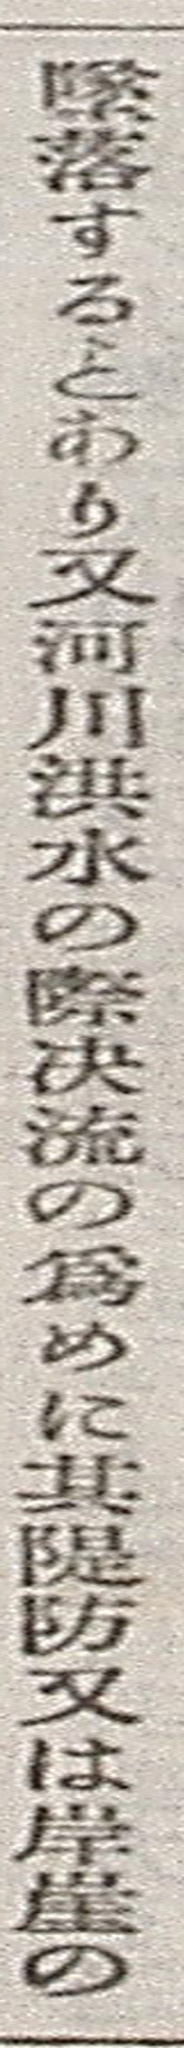墜落することあり又河川洪水の際決流の為めに其堤防又は岸崖の
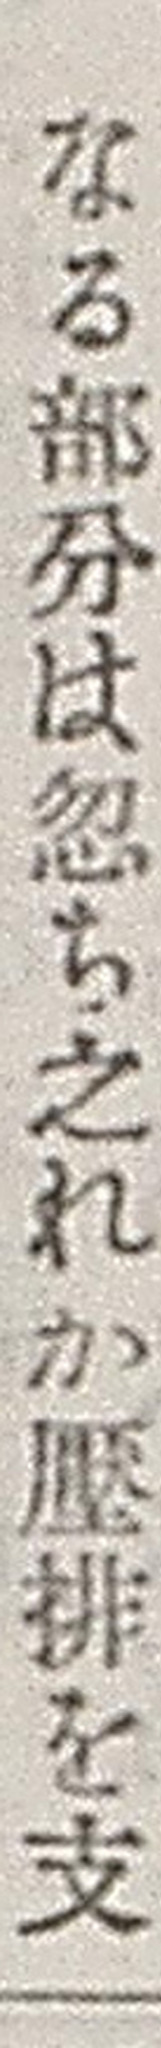なる部分は忽ち之れか圧排を支
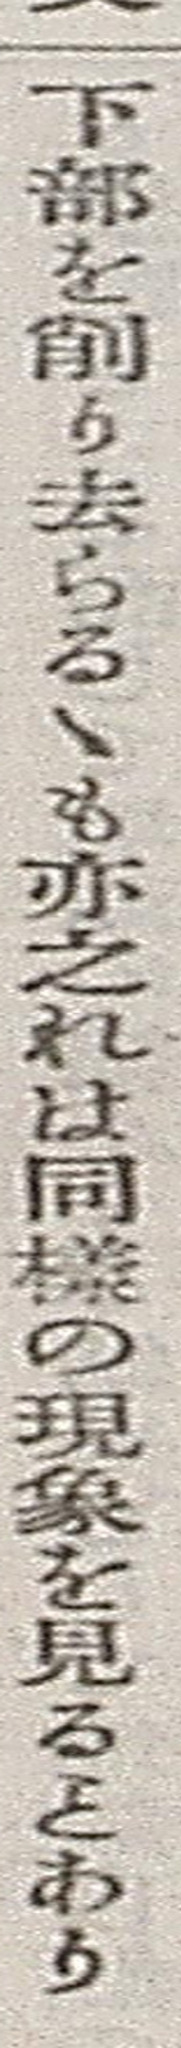下部を削り去らるゝも亦之れは同様の現象を見ることあり
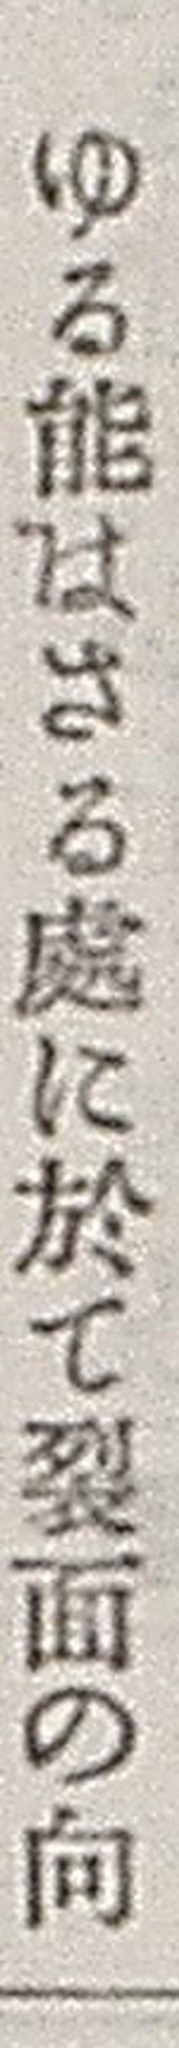ゆる能はさる処に於て裂面の向
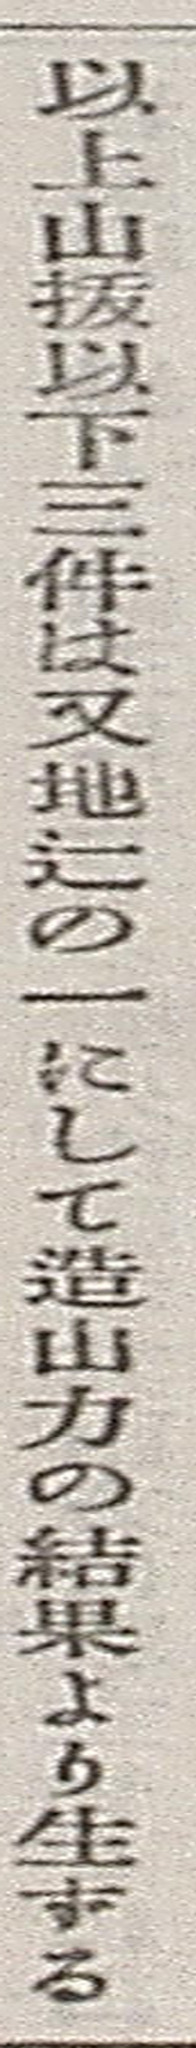以上山抜以下三件は又地辷の一にして造山力の結果より生ずる
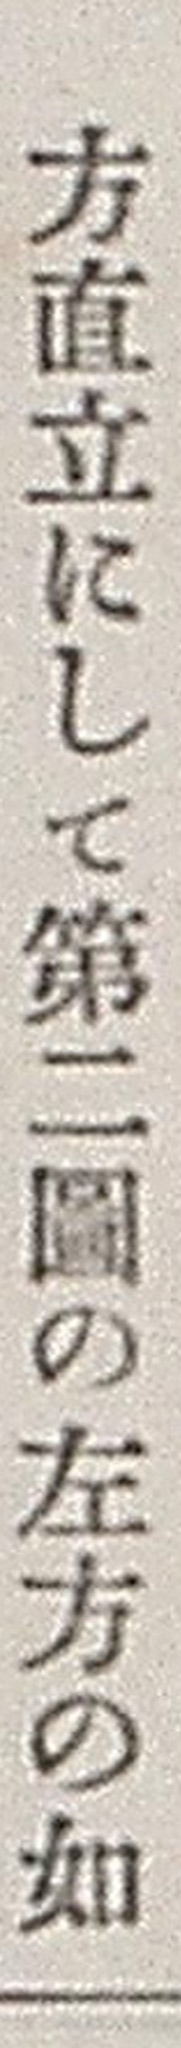方直立にして第二図の左方の如
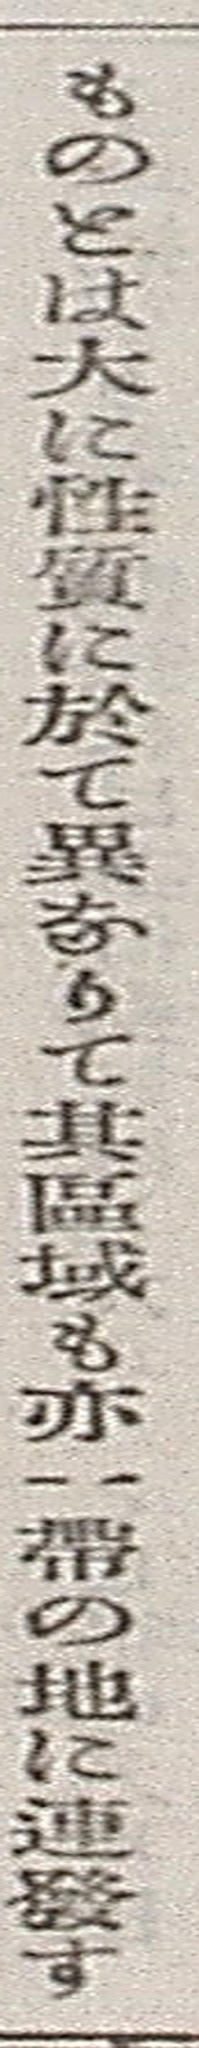ものとは大に性質に於て異なりて其区域も亦一帯の地に連発す
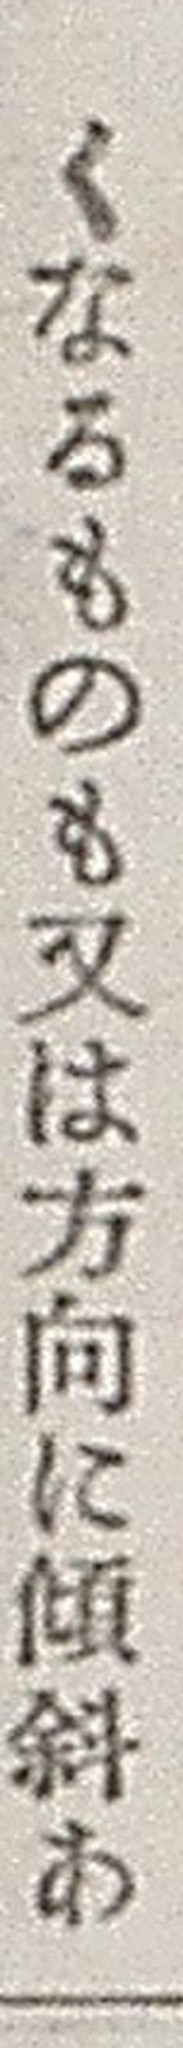くなるものも又は方向に傾斜あ
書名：風俗畫報臨時増刊第百二十號　大海嘯被害録（下）
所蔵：東京大学地震研究所図書室 Earthquake Research Institute Library, The University of Tokyo, JAPAN
